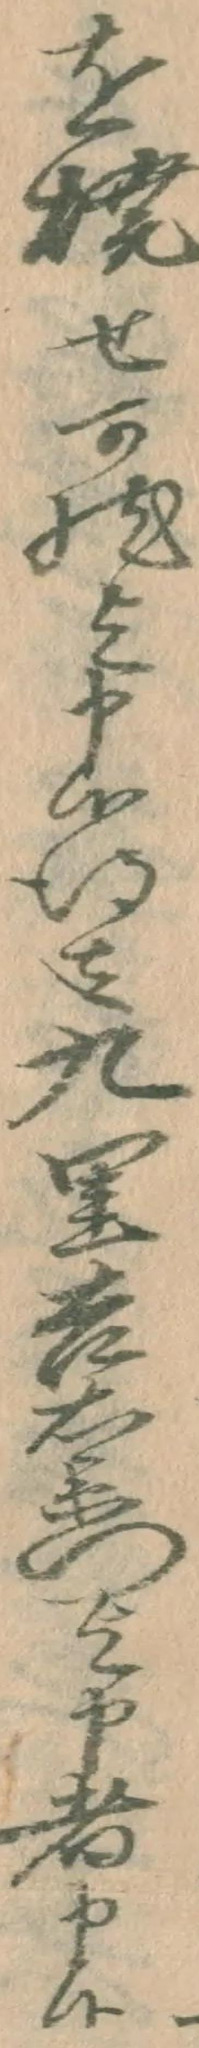を焼せ可然与申候得者九里吉右衛門与申者申候
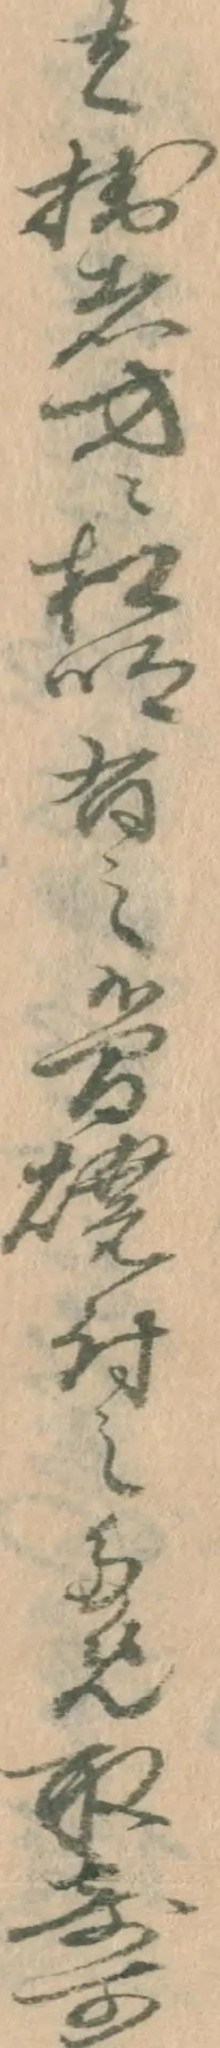者拙者方に松明有之候間焼付之多免取寄可

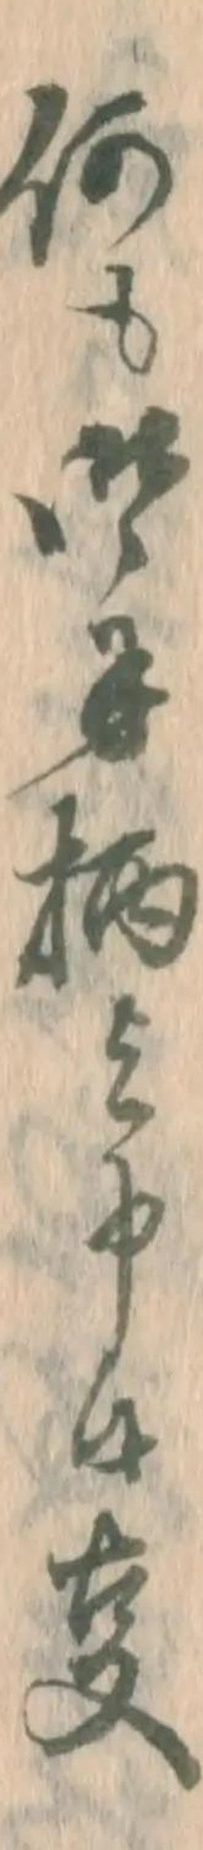何も御手柄与申候事
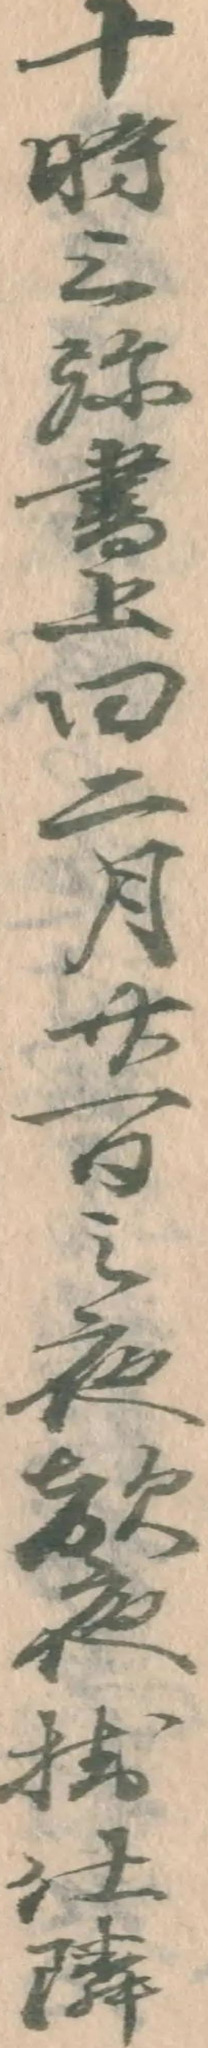十時三弥書上曰二月廿一日之夜敵夜摂仕隣
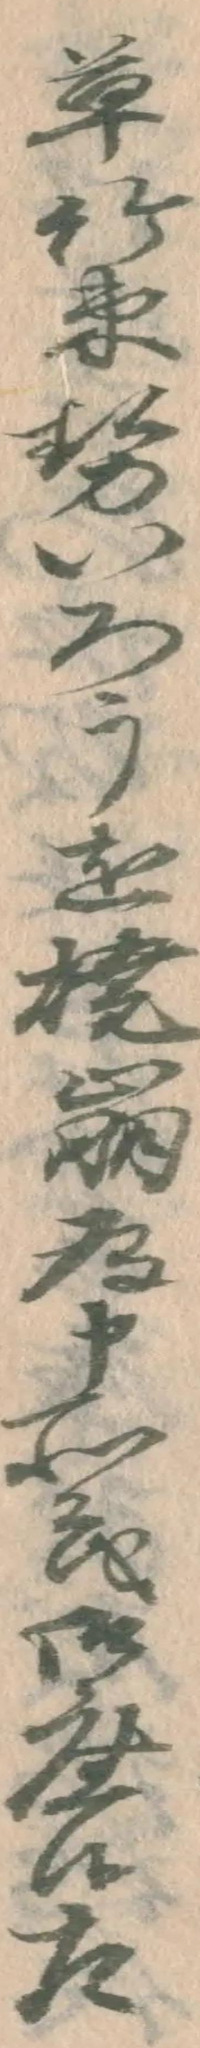草竹束勢いろうを焼崩為申所茂御座候左
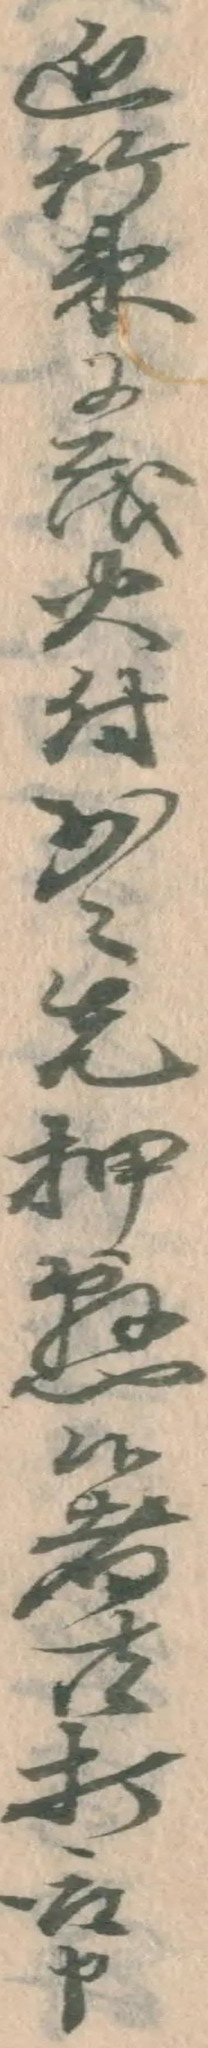近竹束尓茂火付少々先押懸候者共打取申
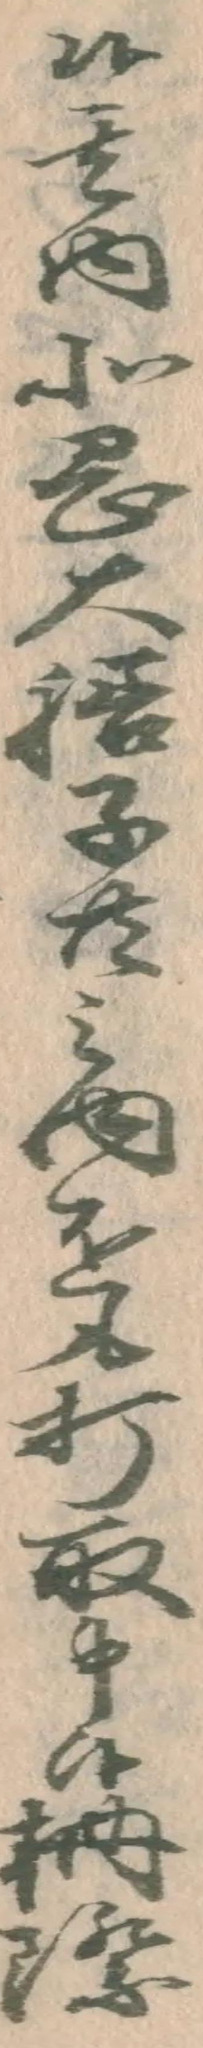候其内北岡大膳子共之内をも打取申候柵際
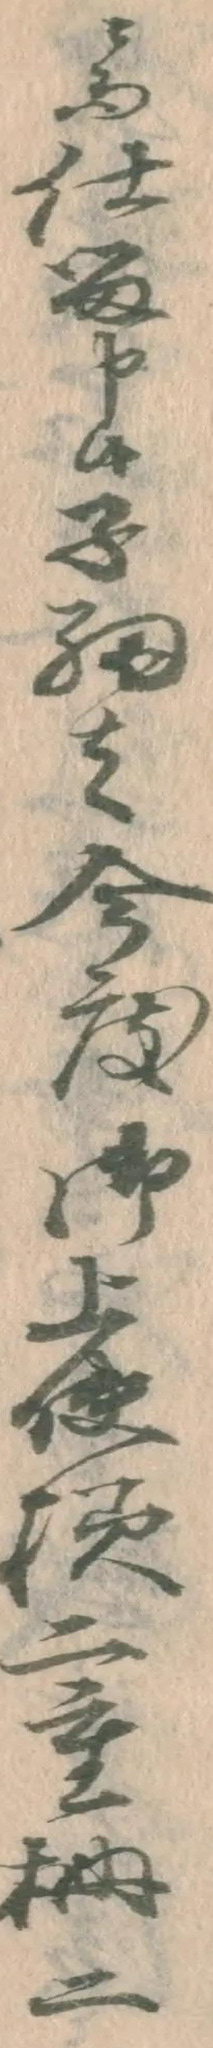に而仕留申候子細者今度御上使様二重柵二
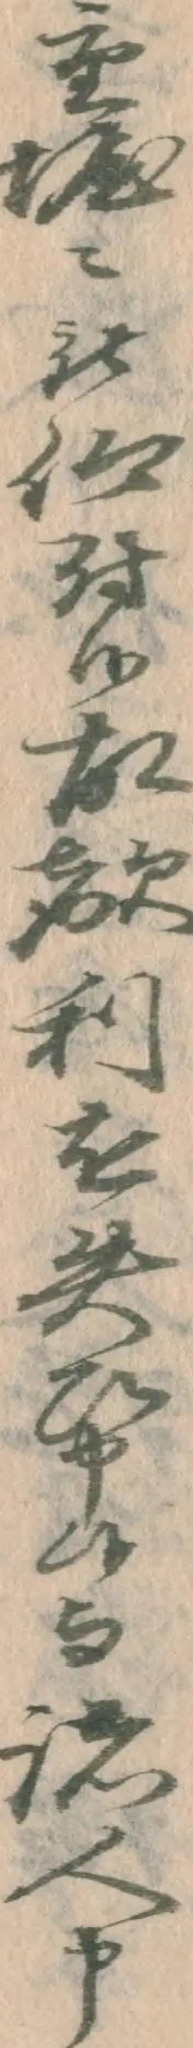重堀に被仰付候故敵利を失ひ申候与諸人申
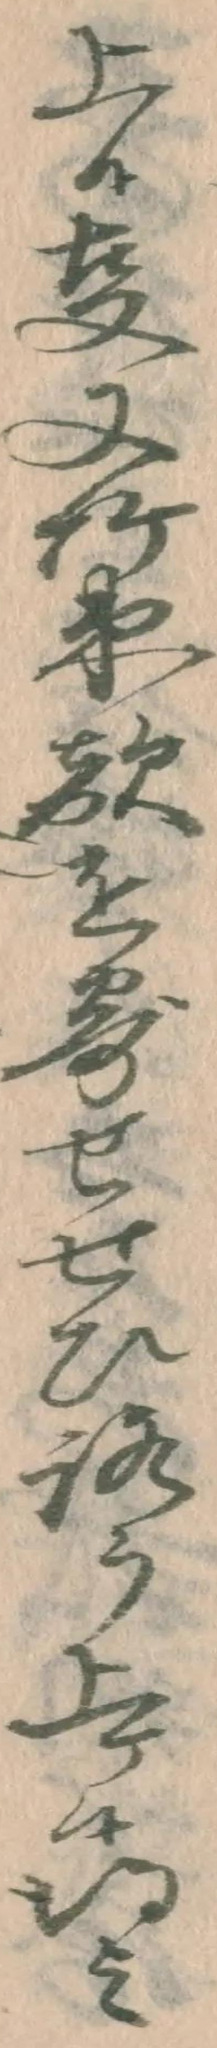上候事又竹束敵を寄せせひ路う上け候得与
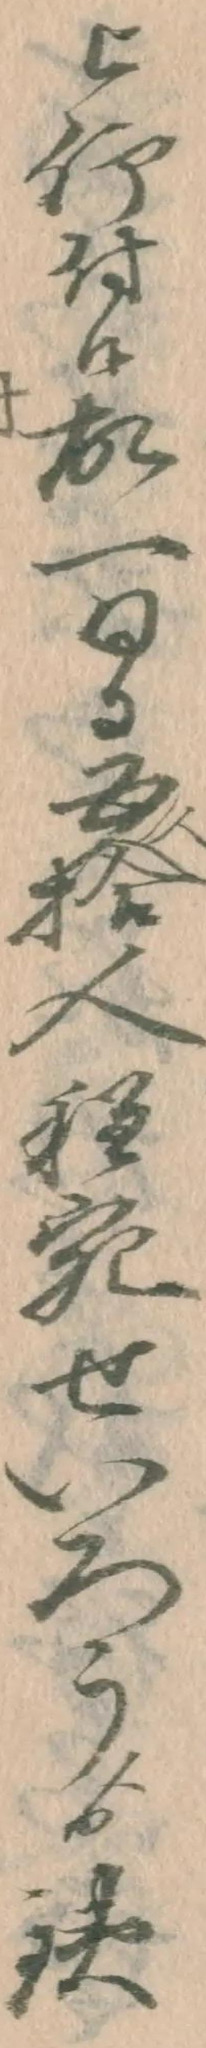被仰付候故一日尓五人拾人程宛せいろうゟ鉄
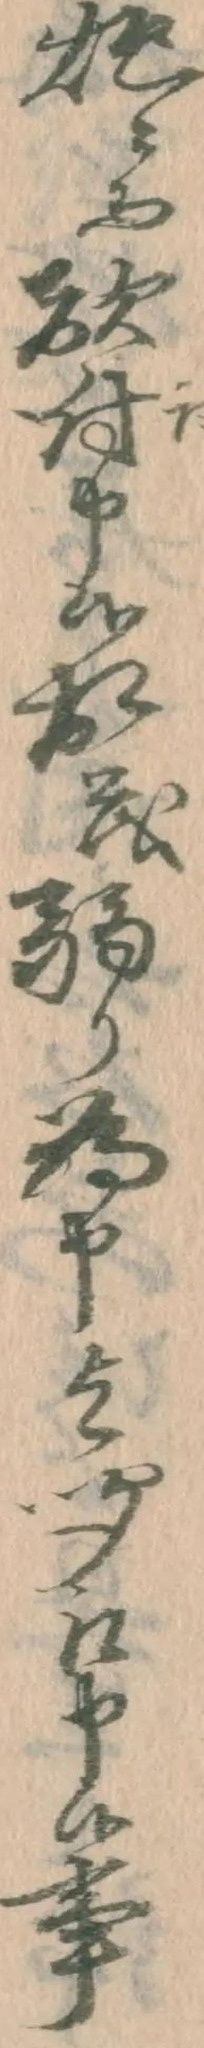炮に而敵討申候故茂弱り為申与聞取申事
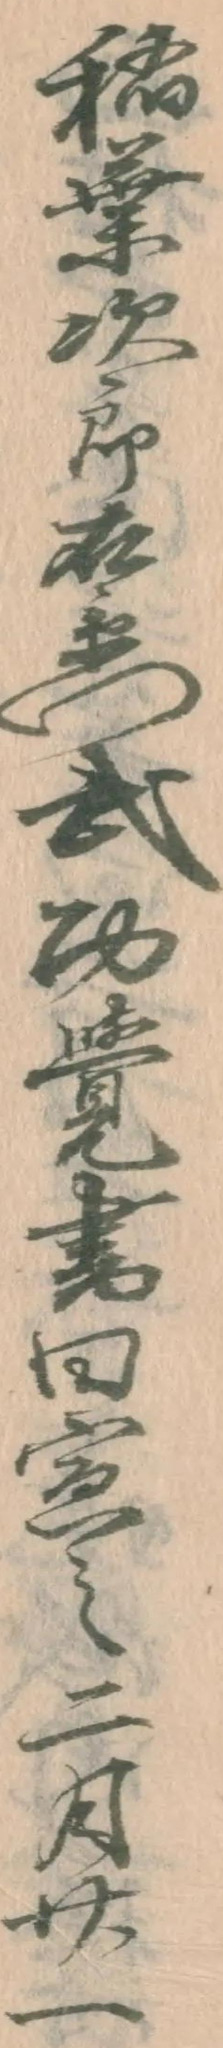稲葉次郎右衛門武功覚書曰寅之二月廿一
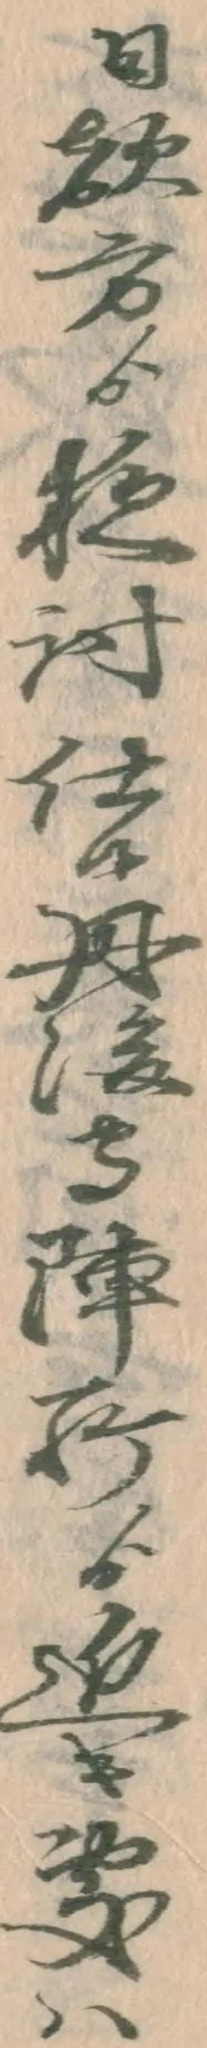日敵方ゟ夜討仕候丹後守陣所ゟ近き處は
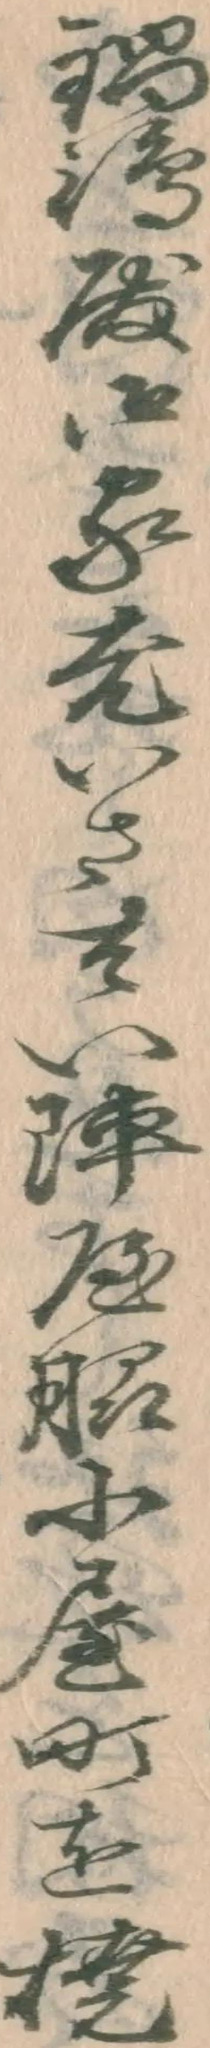鍋島殿御家老いさ者い陣屋脇小屋町を焼
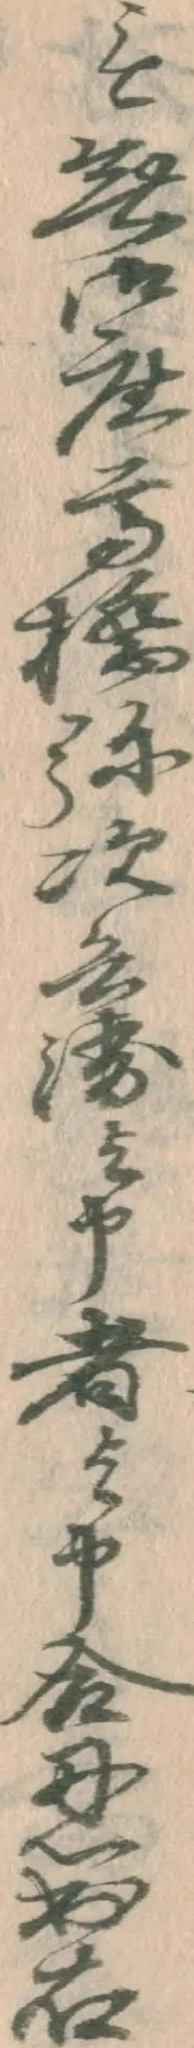も無御座高橋弥次兵衛与申者与申合忍出右
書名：切支丹御退治記 49巻. [7]
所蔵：国立国会図書館 National Diet Library, JAPAN
